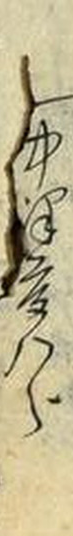中沢藤八郎
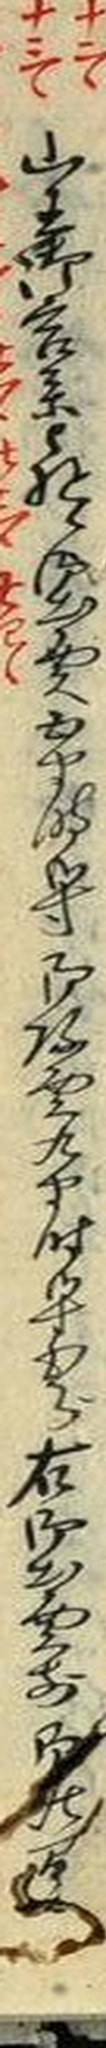山王御宮参被遊候御出殿五半時弐寸御帰殿九半時弐寸五分右御出殿前御居間へ

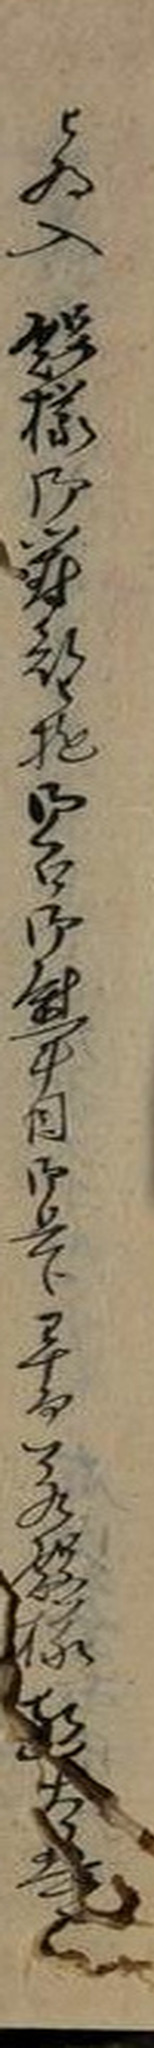被為入殿様御対顔被遊御召御熨斗目御上下畢而若殿様暫大奥へ
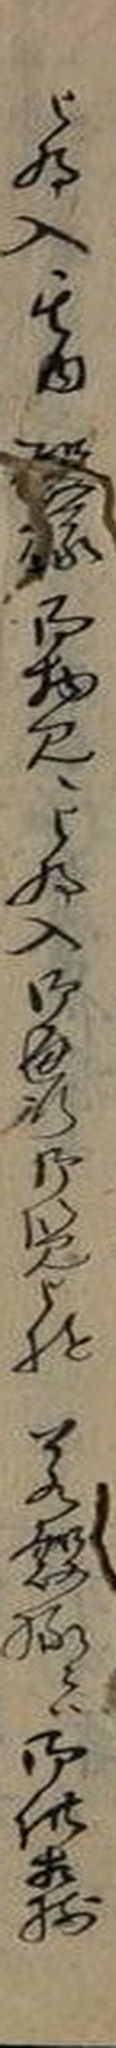被為入其内殿様御物見へ被為入御通行御覧被遊若殿様ニハ御供相揃
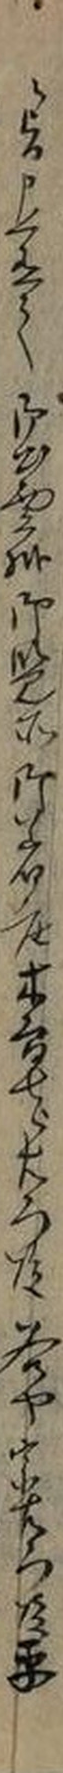候旨申上有之御出殿掛御覧所御着座木曽七郎左衛門殿谷中宗左衛門殿平
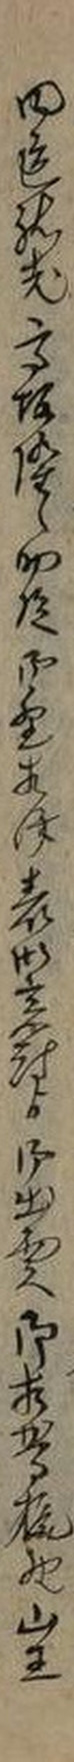田道祐老高坂隆之助殿御逢相済表御玄関ゟ御出殿御相駕梶野山王
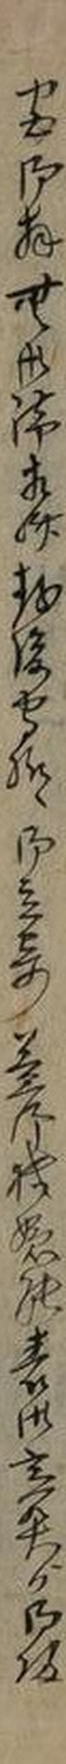宮御拝無御滞相済越後守様へ御立寄益御機嫌能表御玄関ゟ御帰
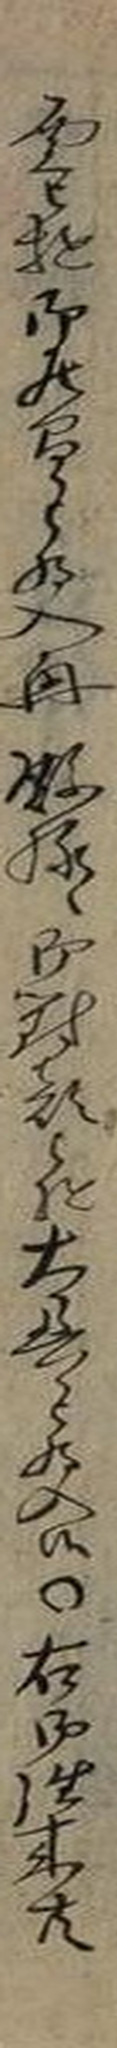殿被遊御居間被為入再殿様へ御対顔被遊大奥へ被為入候〇右御往来共
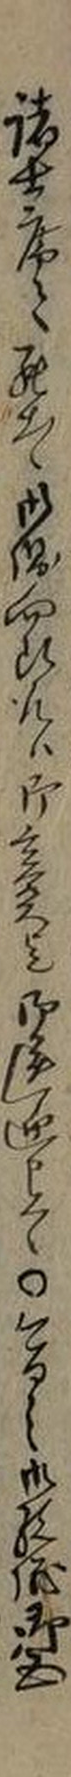諸士席々罷出候御側向頭取ハ御玄関迄御送迎申上候〇今日之御祝儀御五
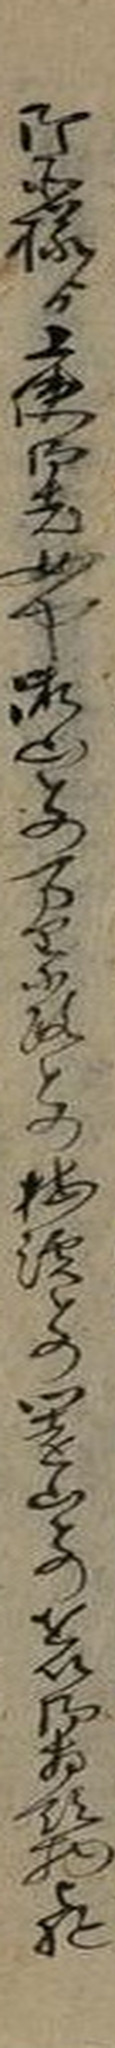御所様ゟ上使御老女中瀬山との万里小路との梅浜との遠山とのを以御拝領物被遊
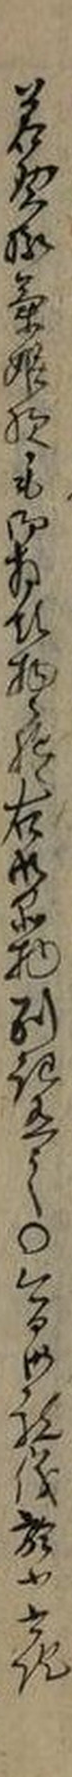若殿様菊姫様ニも御拝領物被遊候右御品物別記有之〇今日御祝儀於小書院
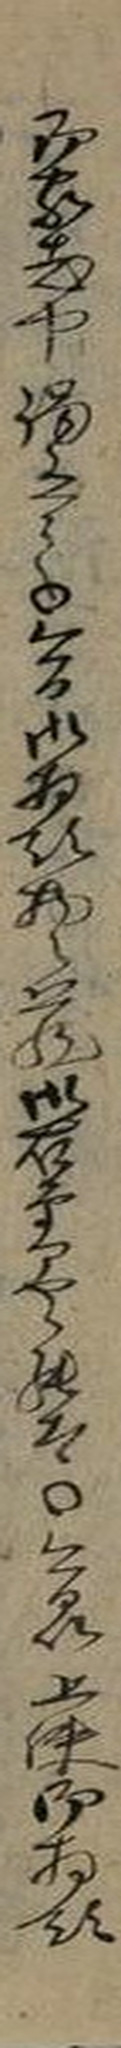御家老中謁有之〇今日御拝領物之恐悦御右筆部やへ罷出候〇今日以上使御拝領
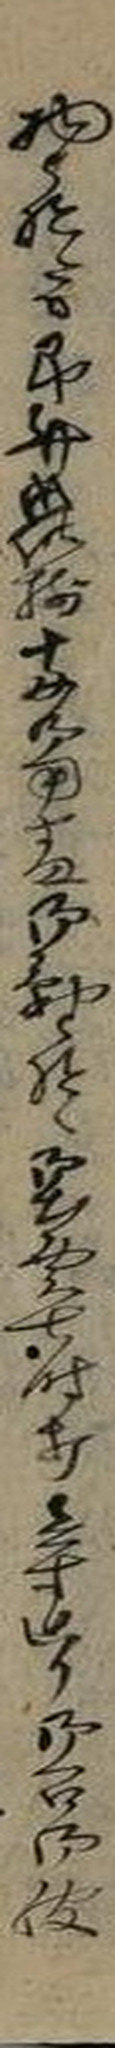物被遊候ニ付即刻御供揃両御用番御勤被遊候御出殿七時打壱寸廻り御召御服
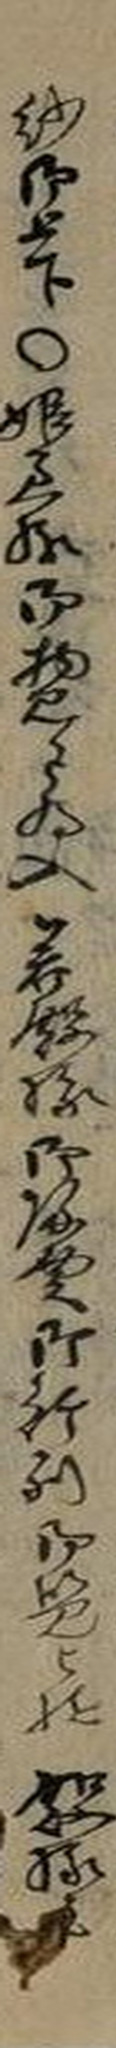紗御上下〇姫君様御物見へ被為入若殿様御帰殿御行列御覧被遊殿様も
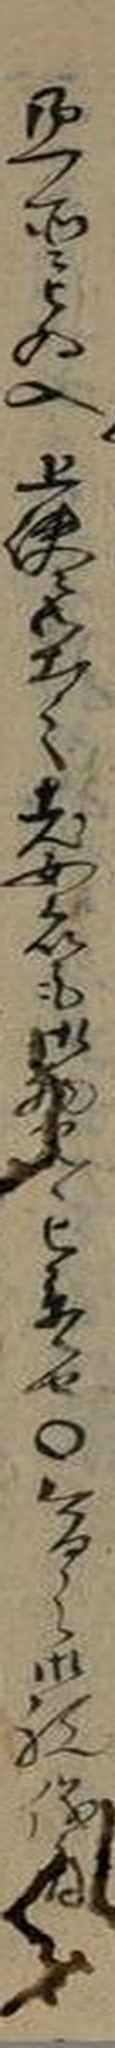御一所ニ被為入上使ニ御出之老女衆も御物見へ被参候由〇今日御祝儀ニ付
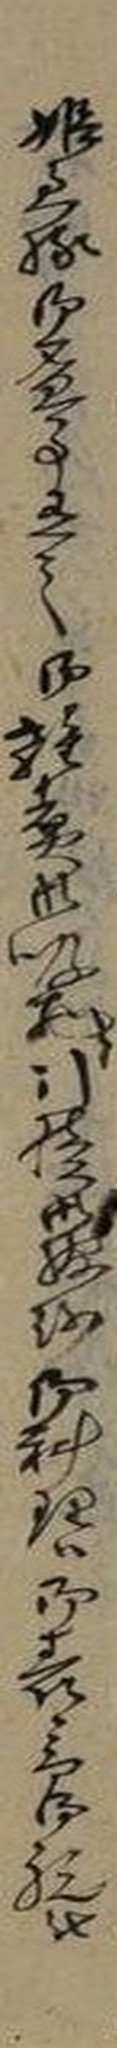姫君様御盃事有之御雑煮御吸物引続御服沙御料理ハ御表而ニ而御祝被
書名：少傅日録抄（斉承付側向頭取日記、在府）
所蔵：福井県文書館 Fukui Prefectural Archives
